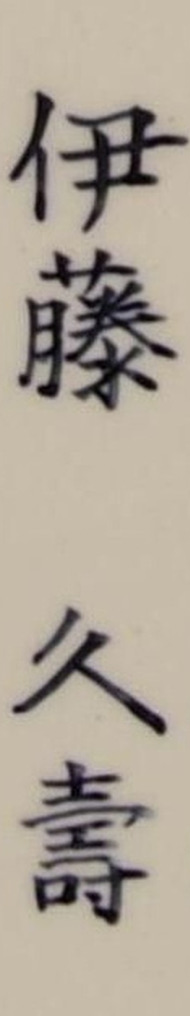伊藤久壽
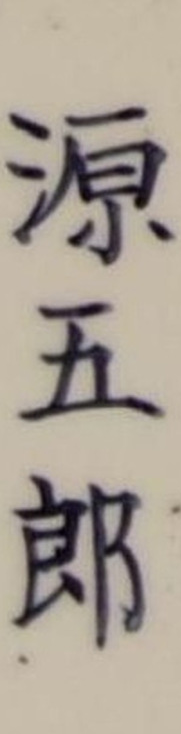源五郎
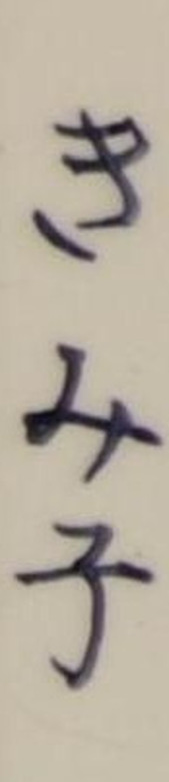きみ子

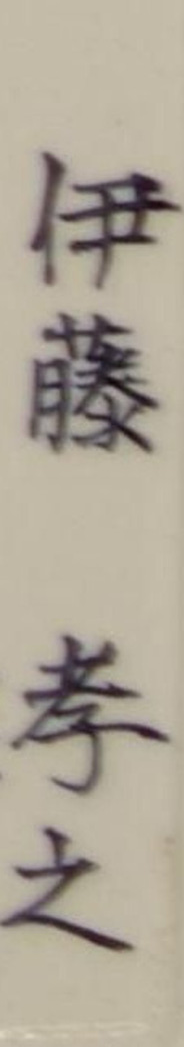伊藤孝之
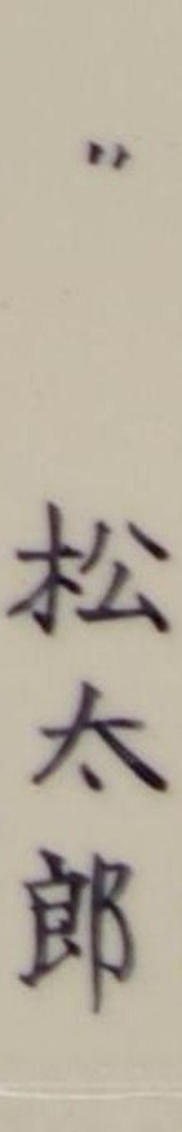松太郎
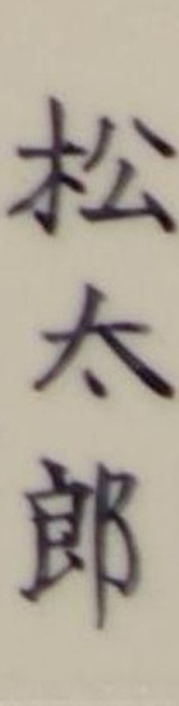松太郎
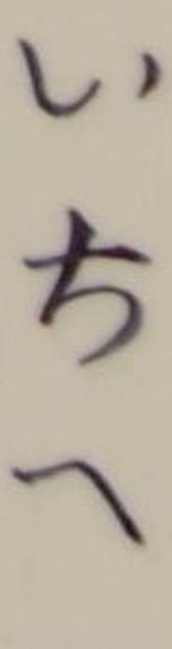いちへ
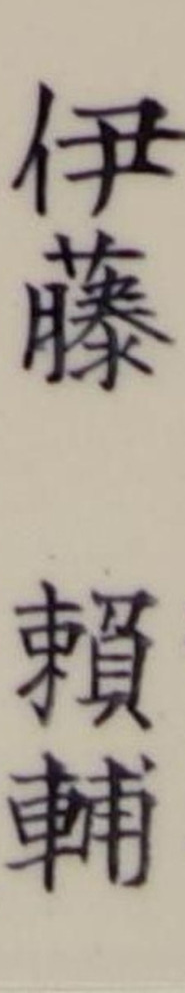伊藤頼輔
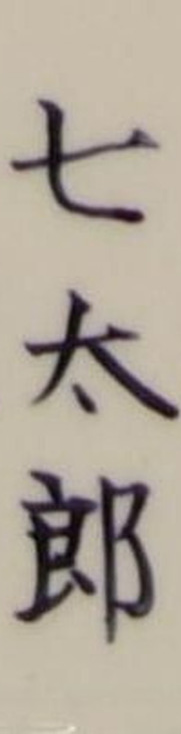七太郎
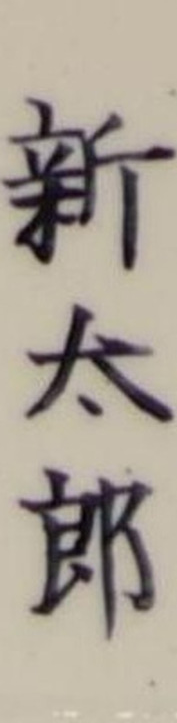新太郎
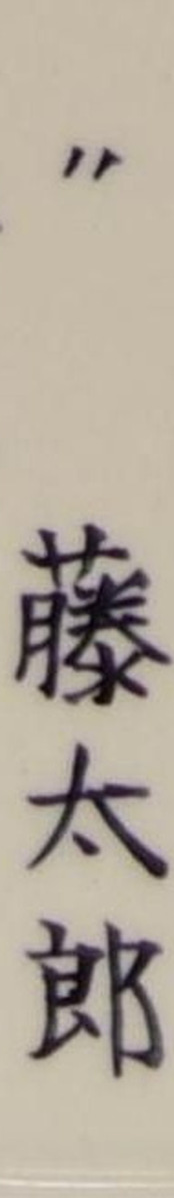藤太郎
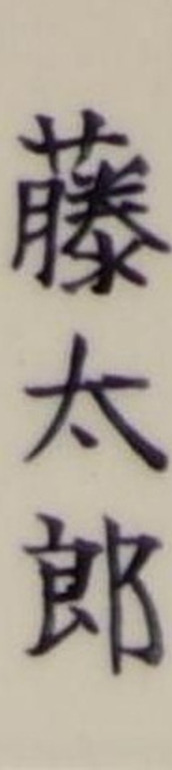藤太郎
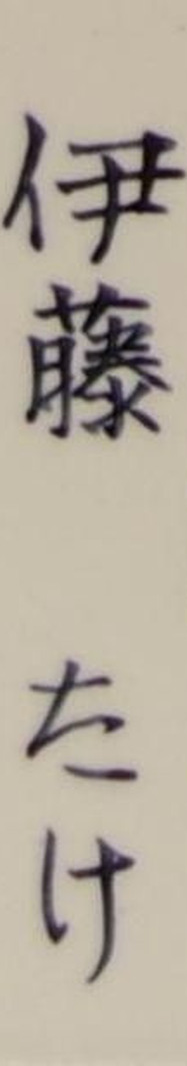伊藤たけ
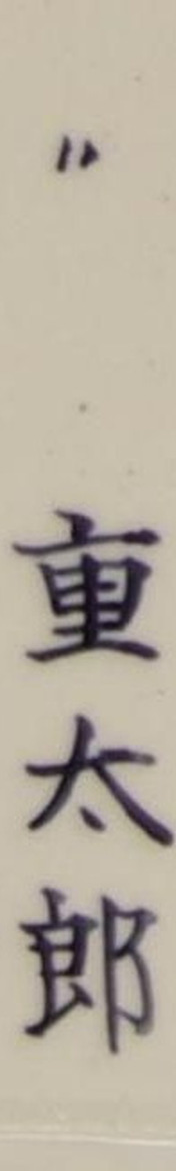重太郎
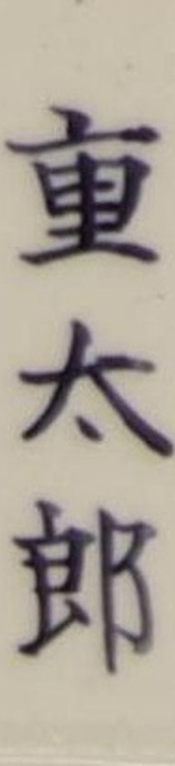重太郎

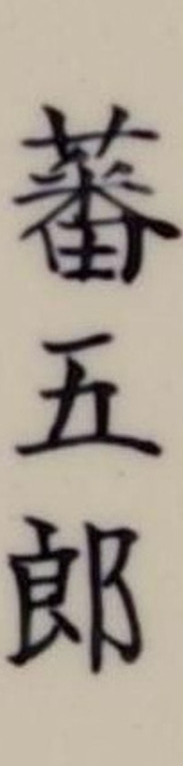蕃五郎
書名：M~S
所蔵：高野山金剛峯寺
